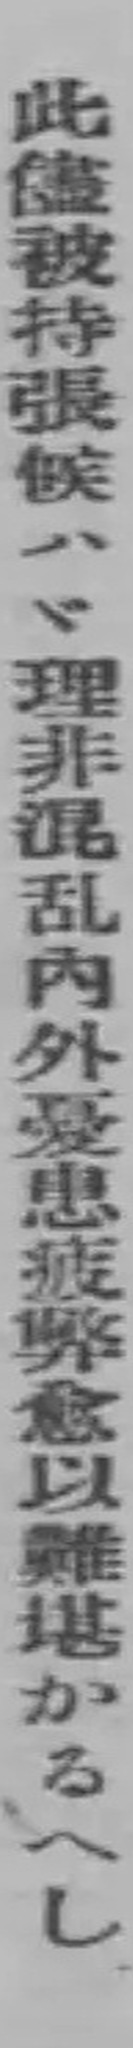此侭被持張候ハヾ理非混乱内外憂患疲弊愈以難堪かるへし
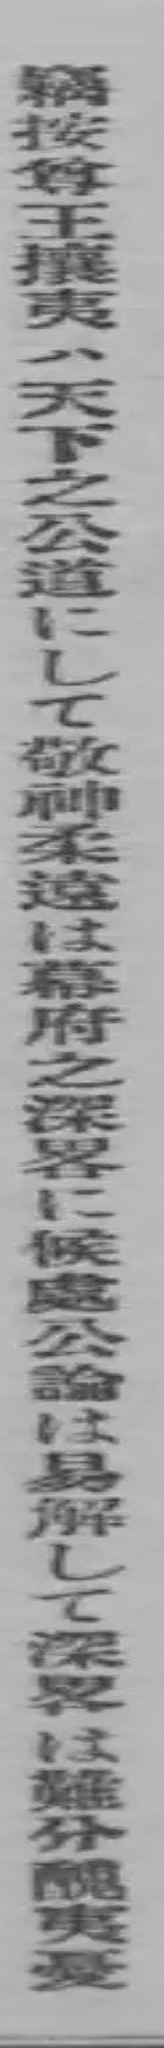竊按尊王攘夷ハ天下之公道にして敬神柔遠は幕府之深略に候処公論は易解して深略は難分醜夷憂
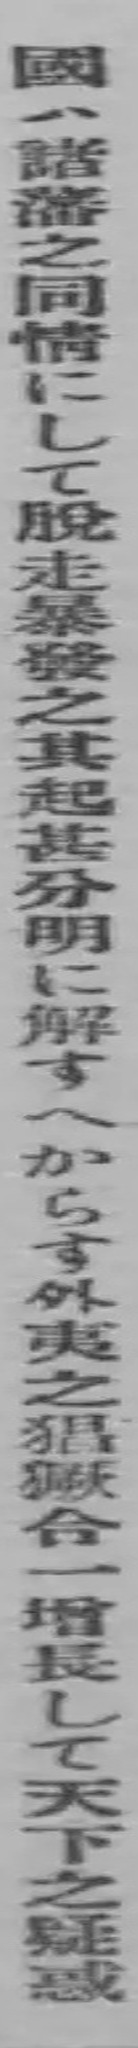国ハ諸藩之同情にして脱走暴発之其起甚分明に解すへからす外夷之猖獗合一増長して天下之疑惑
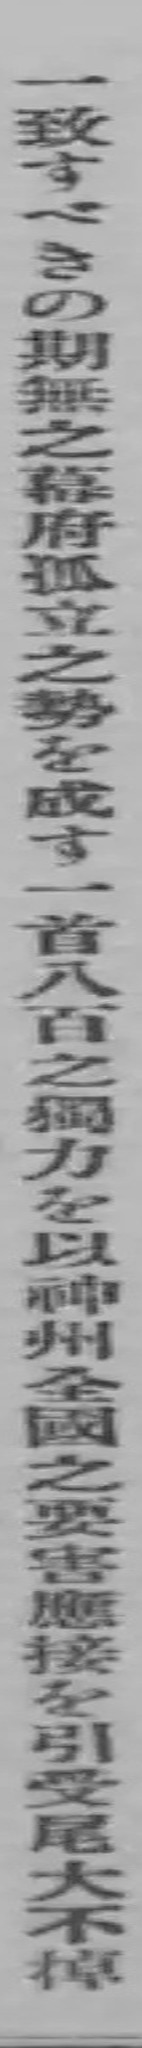一致すべきの期無之幕府孤立之勢を成す一首八百之独力を以神州全国之要害応接を引受尾大不棹
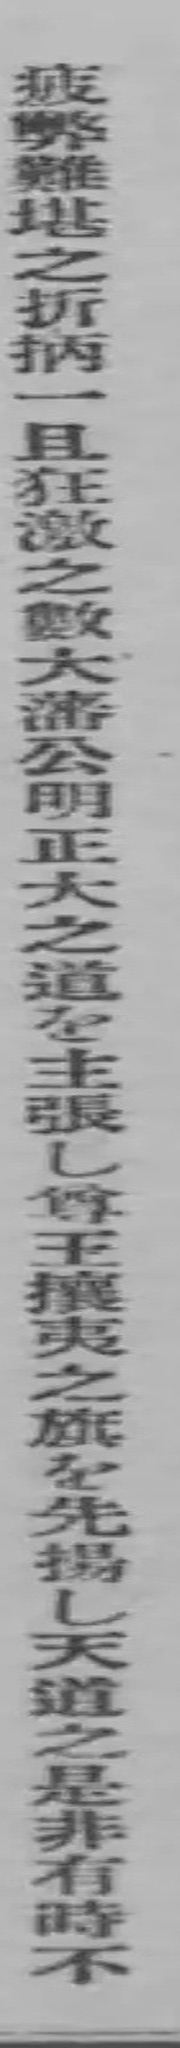疲弊難堪之折柄一且狂激之数大藩公明正大之道を主張し尊王攘夷之旗を先揚し天道之是非有時不
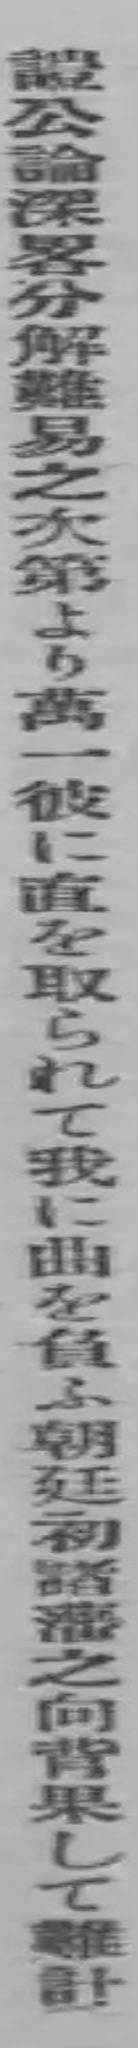証公論深略分解難易之次第より万一彼に直を取られて我に曲を負ふ朝廷初諸藩之向背果して難計
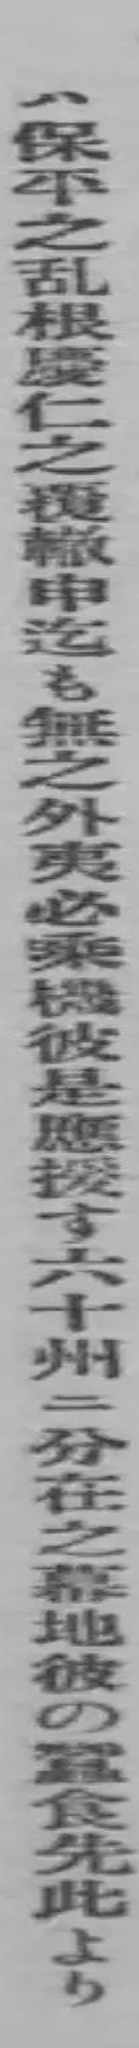ハ保平之乱根慶仁之覆轍申迄も無之外夷必乗機彼是応援す六十州ニ分在之幕地彼の蠶食先此より
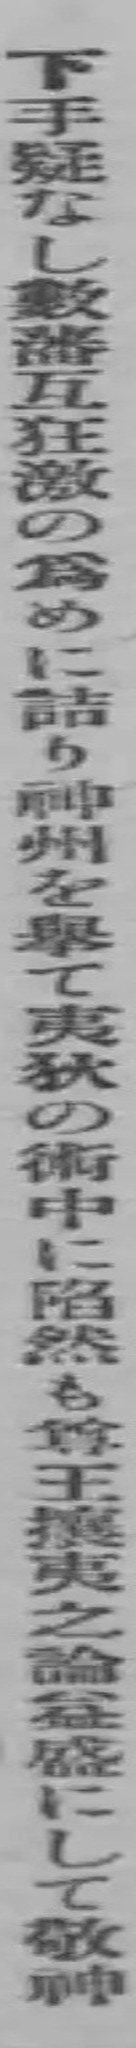下手疑なし数藩互狂激の為めに詰り神州を挙て夷狄の術中に陥然も尊王攘夷之論益盛にして敬神
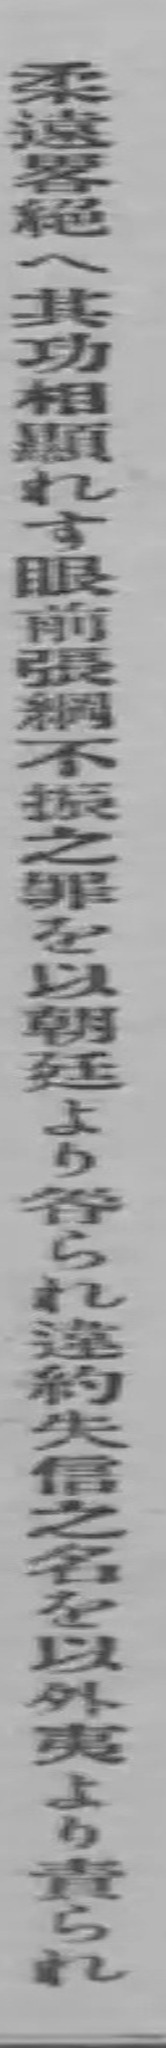柔遠略絶へ其功相顕れす眼前張網不振之罪を以朝廷より咎られ違約失信之名を以外夷より責られ
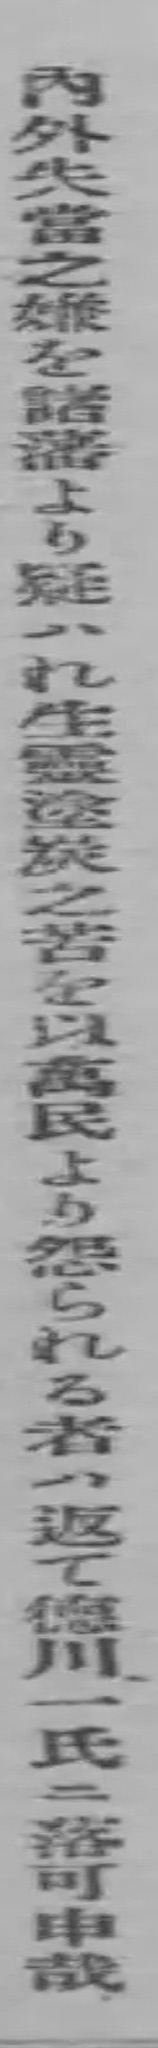内外失当之嫌を諸藩より疑ハれ生霊塗炭之苦を以万民より怨られる者ハ返て徳川一氏ニ落可申哉

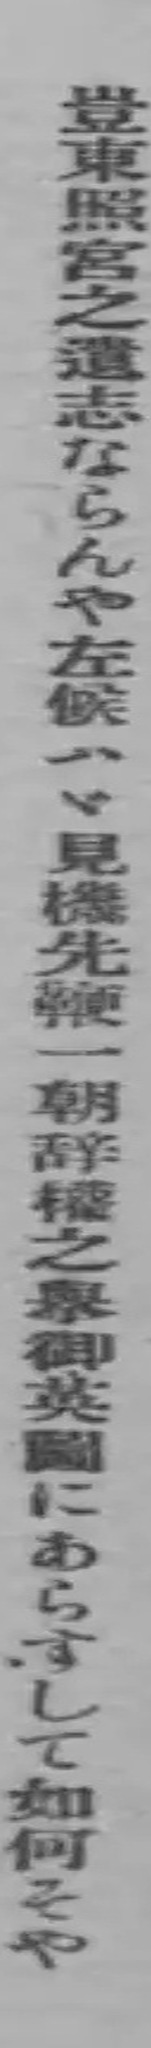豈東照宮之遺志ならんや左候ハヾ見機先鞭一朝辞権之挙御英図にあらすして如何そや
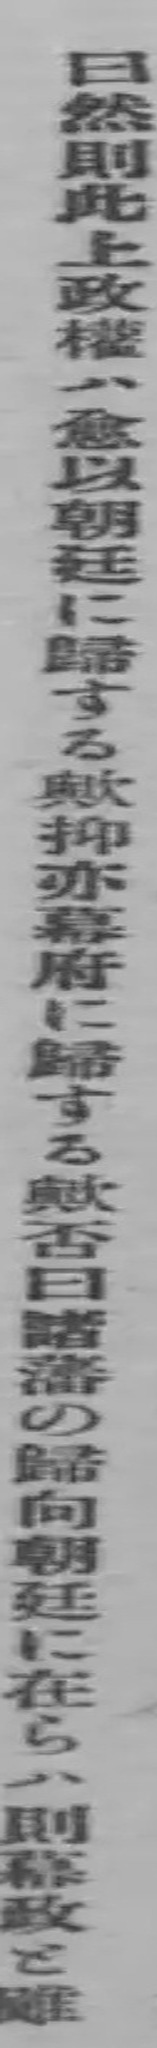曰然則此上政権ハ愈以朝廷に帰する歟抑亦幕府に帰する歟否曰諸藩の帰向朝廷に在らハ則幕府と雖
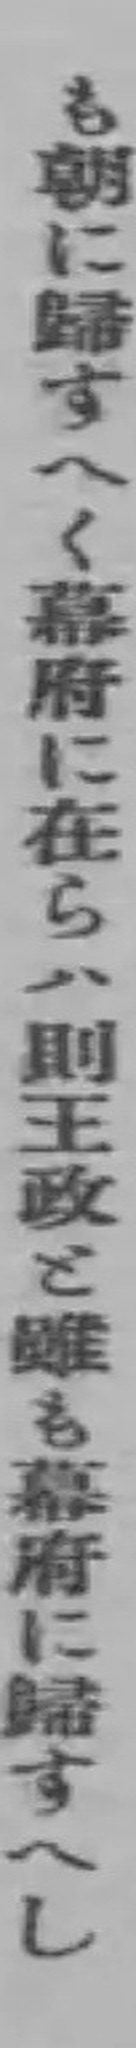も朝に帰すへく幕府に在らハ則王政と雖も幕府に帰すへし
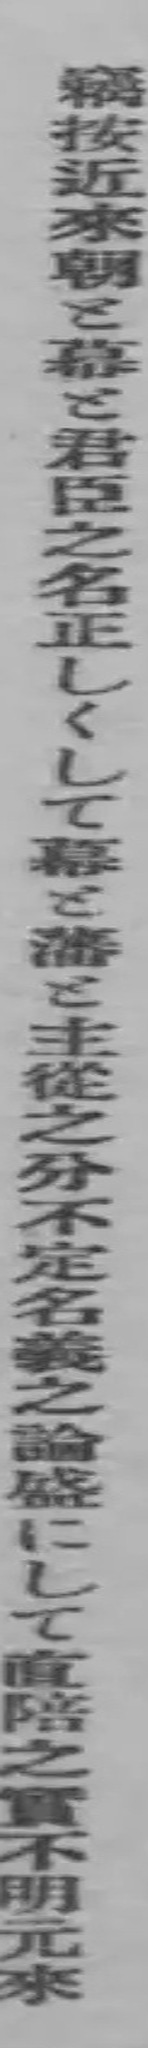竊按近来朝と幕と君臣之名正しくして幕と藩と主従之分不定名義之論盛にして直陪之実不明元来
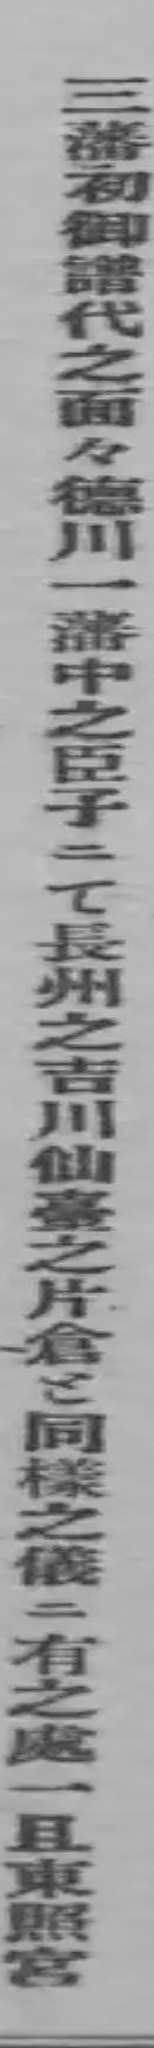三藩初御譜代之面々徳川一藩中之臣子ニて長州之吉川仙台之片倉と同様之儀ニ有之処一旦東照宮
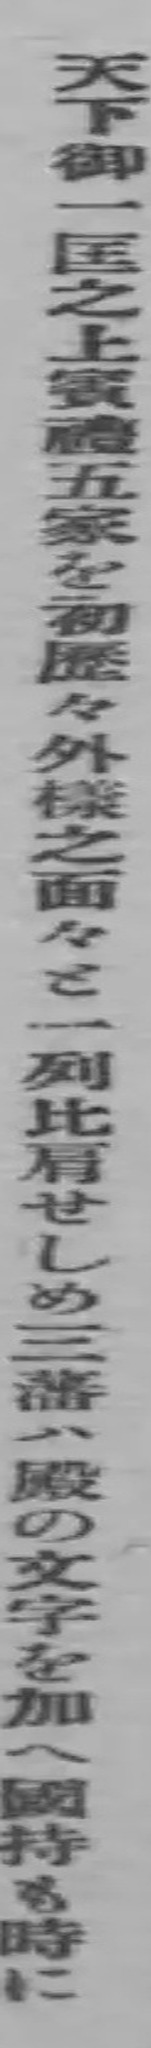天下御一匡之上賓礼五家を初歴々外様之面々と一列比肩せしめ三藩ハ殿の文字を加へ国持も時に
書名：豊橋市史談
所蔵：国立国会図書館 National Diet Library, JAPAN
